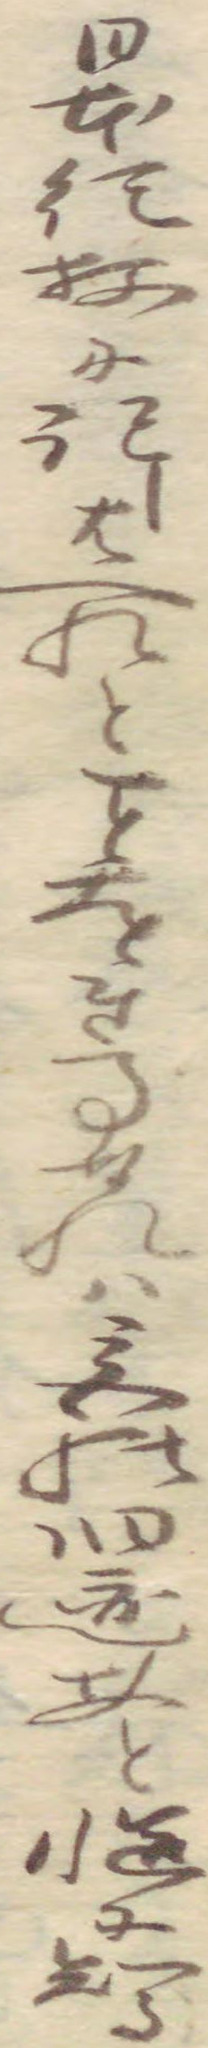日本記抔に記しはへれとも遠き事なれは宮の旧跡なと慥に知る
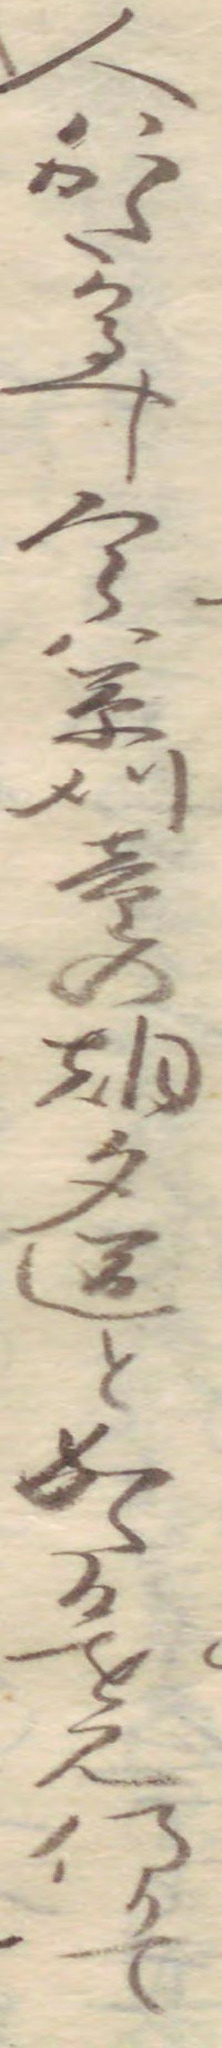人はかたかるへし今は草刈童の朝夕道と成たるを見侍りて
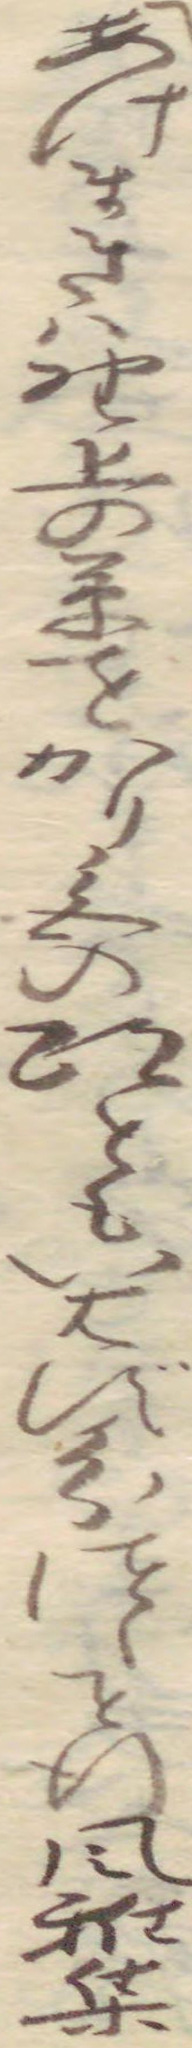〽あけまきは野上の草をかり宮の跡ともいはず分つゝそ行風雅集
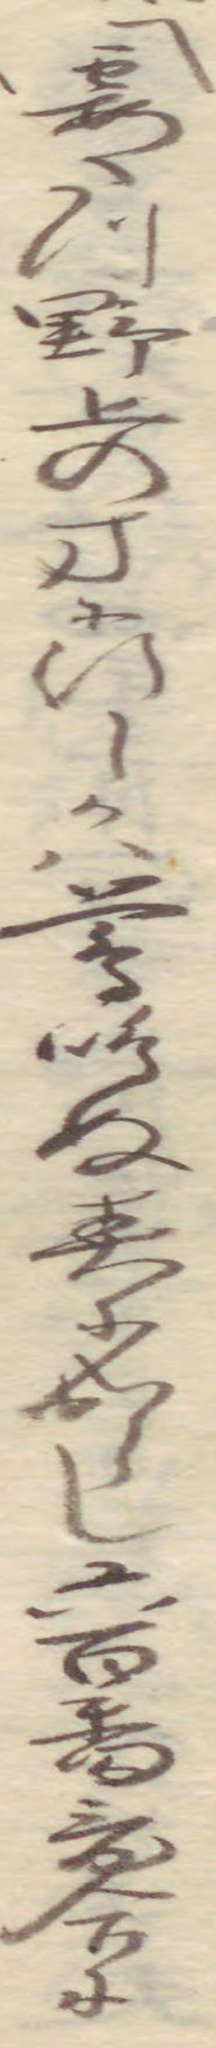〽霞たつ野上の方に行しかは鶯鳴ぬ春に成らし六百番歌合に
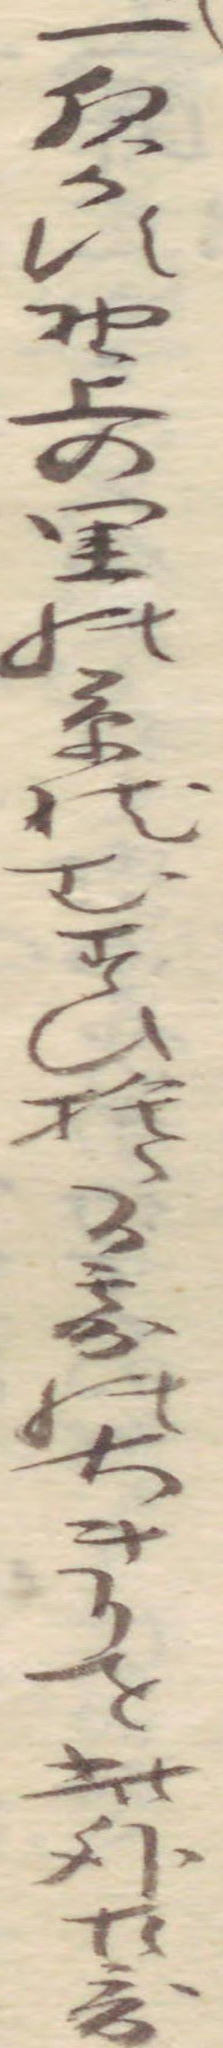〽一夜かす野上の里の草枕むすひ捨たる露のちきりを此外古歌
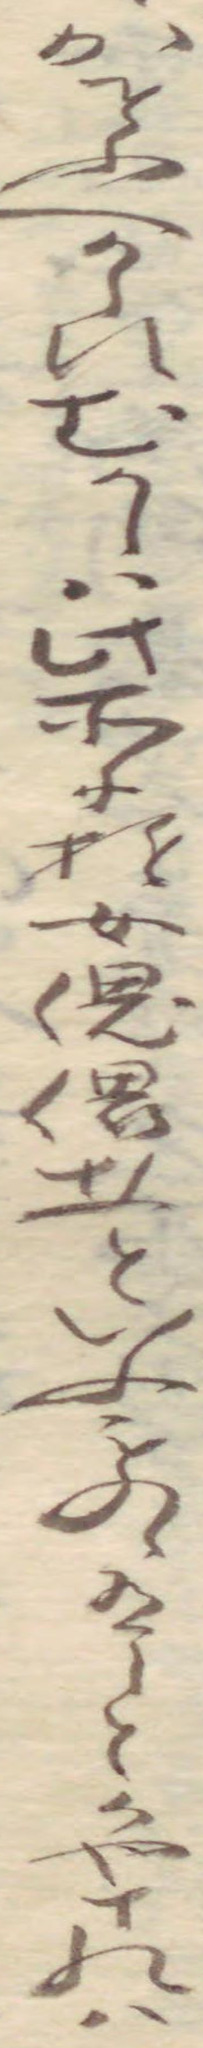かそふへからすむかしは此所に遊女傀儡なといふものゝ有しとかやされは
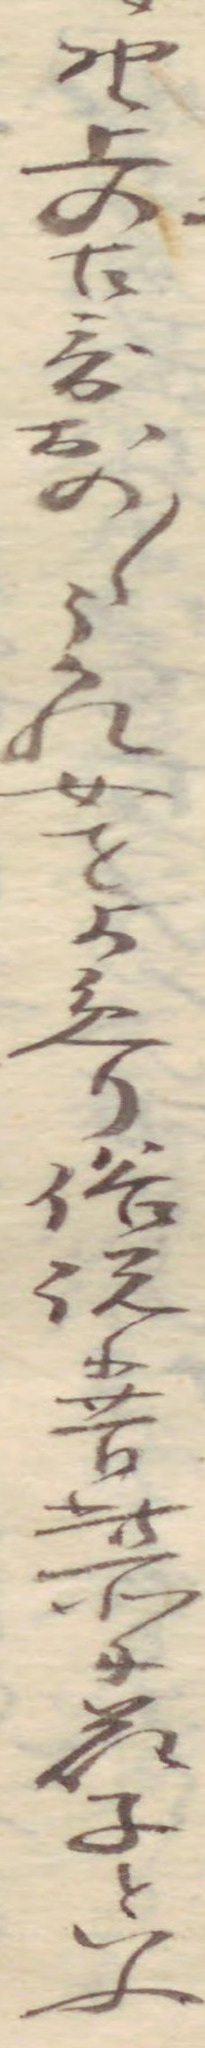野上の古歌おの〳〵うかれ女をよめり俗説に昔此所に花子といふ
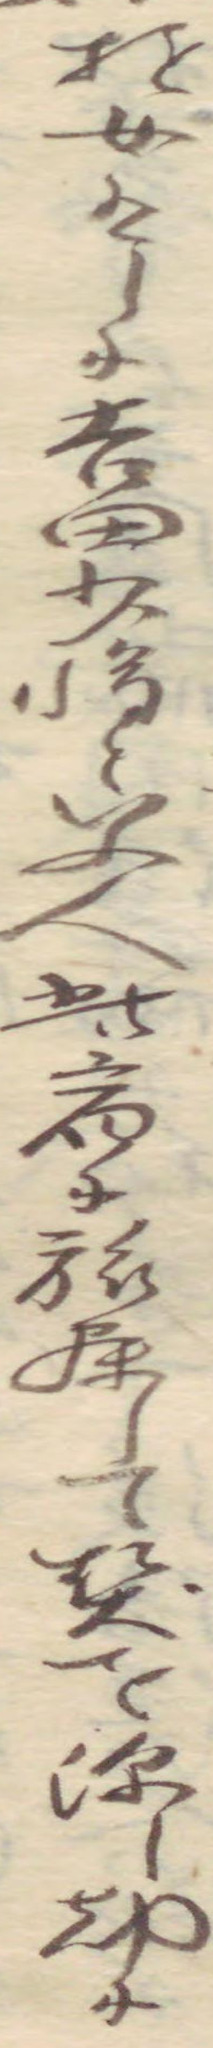遊女有しに吉田少将といふ人此宿に旅寝して契を深し都に
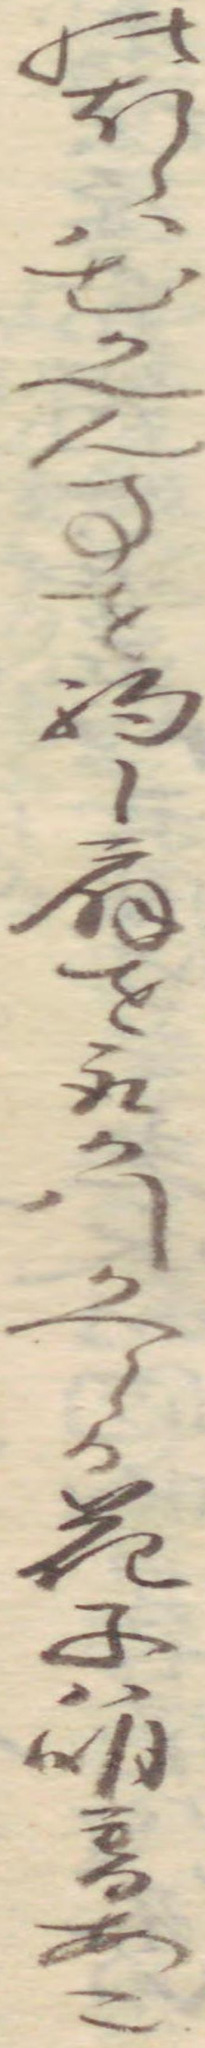のほらはむかへん事を約し扇を取かはしかへしか花子は明暮あこ
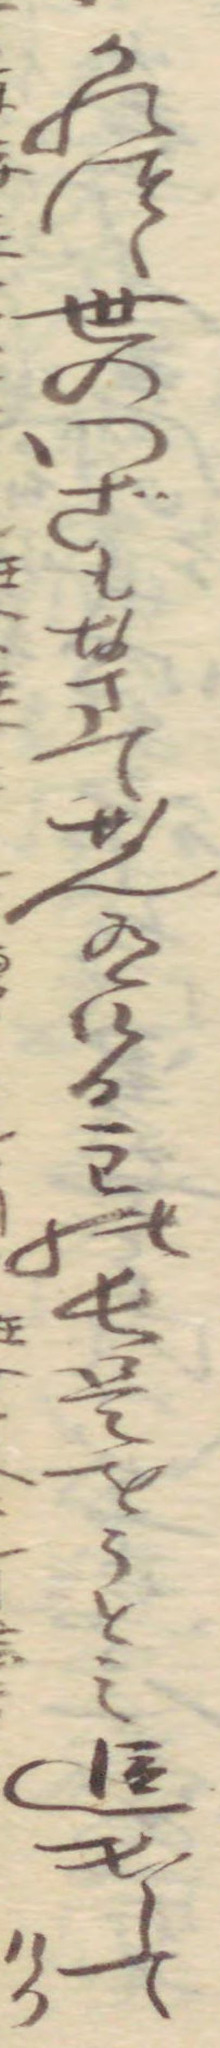かれつゝ世のわざもなさてなん有ける主の長是をうとみ追出してけり
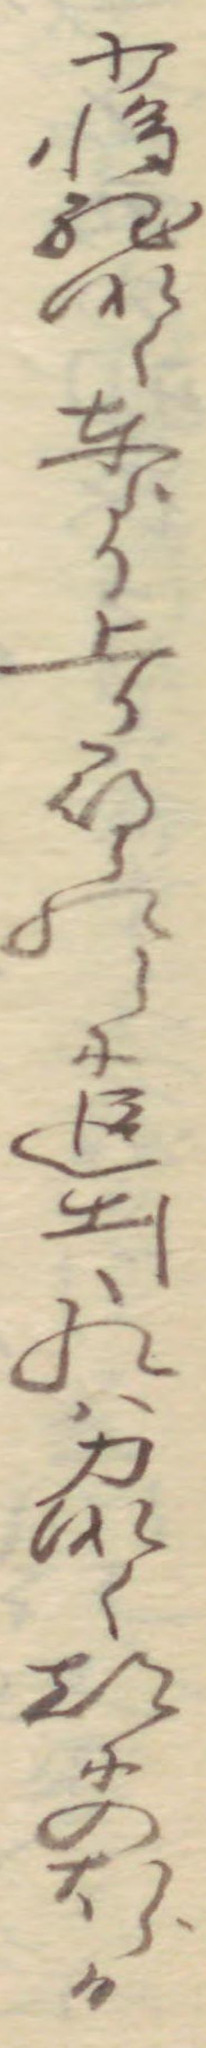少将程なく東より上り尋られしに追出したれは力なく都にのほらる
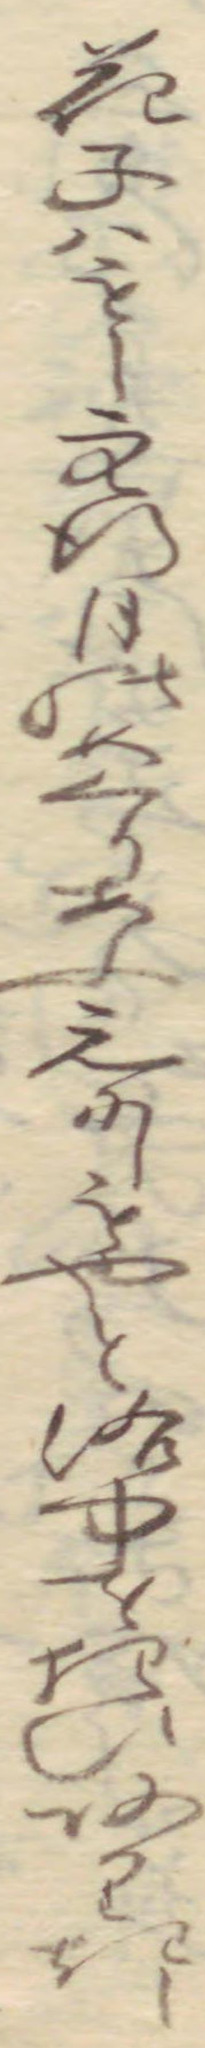花子はもし空行月のめくりあふえにしもやと洛中を狂ひありきし
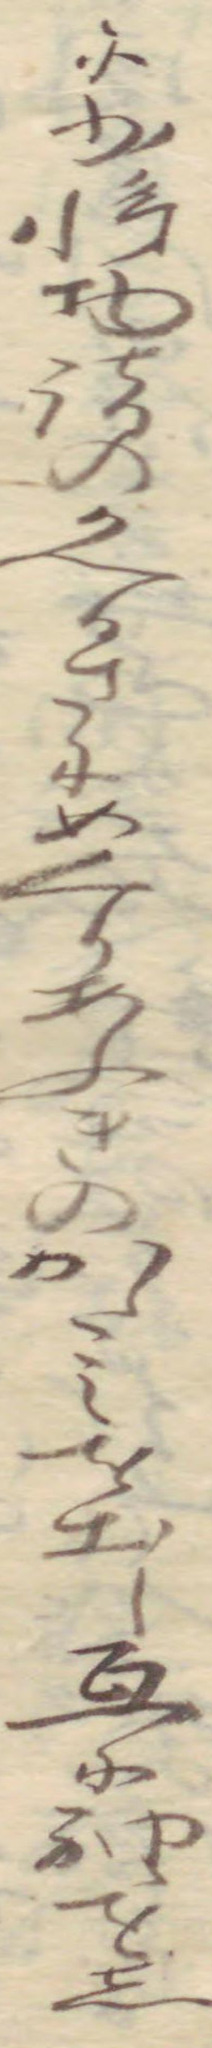に少将物詣のかへるさにめくりあふきのかたみを出し互に袖をし
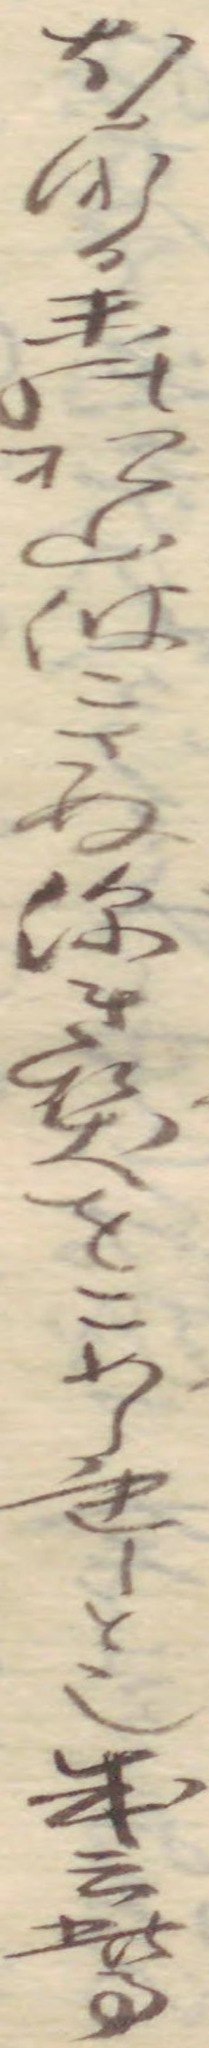ほるなる末の松山波越さぬ深き契をこめられしと也或云此事
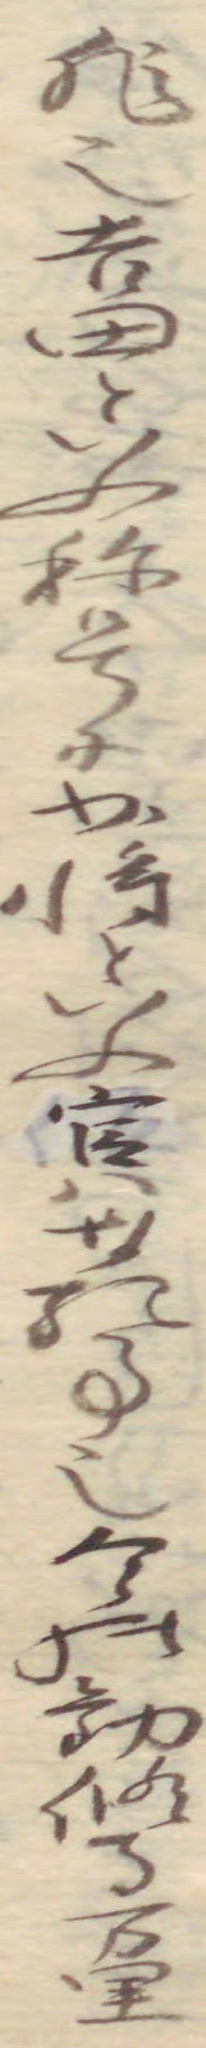非也吉田といふ称号に少将といふ官はなき事也今の勧修寺万里
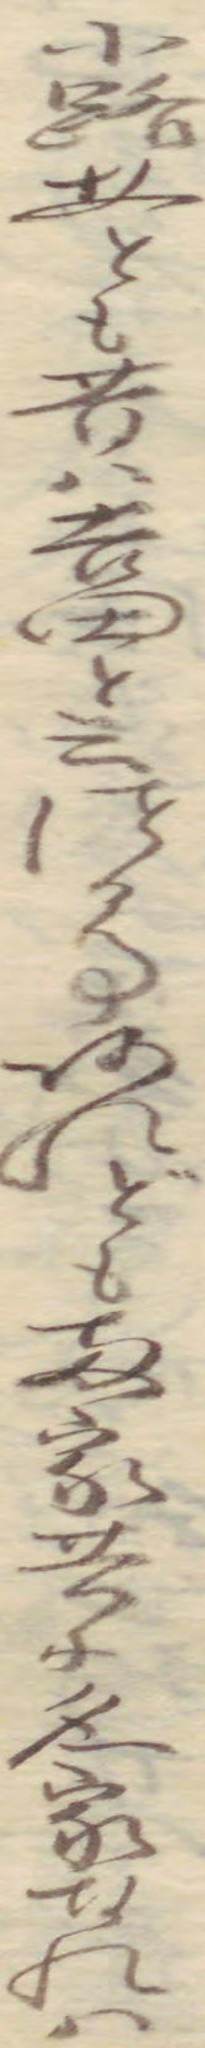小路なとも昔は吉田と云つる事あれども両家共に名家なれは
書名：鶯宿雑記. 巻263-264
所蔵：国立国会図書館 National Diet Library, JAPAN
